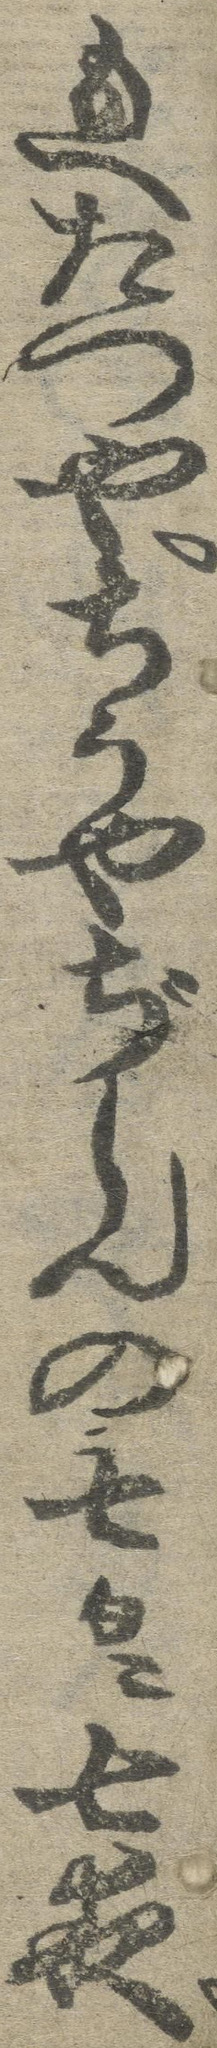もへたつや。ちうやぢしんの七日ニ七夜。
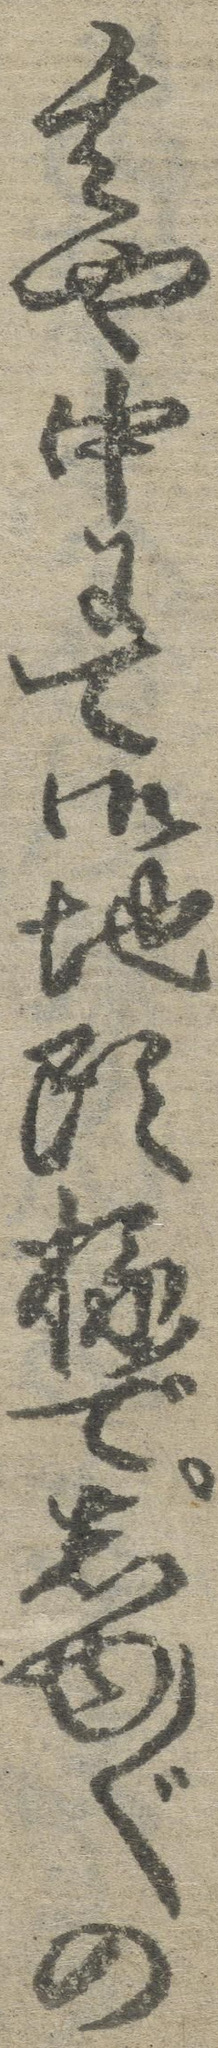其や中にて御地頭様で。しゆ〴〵の
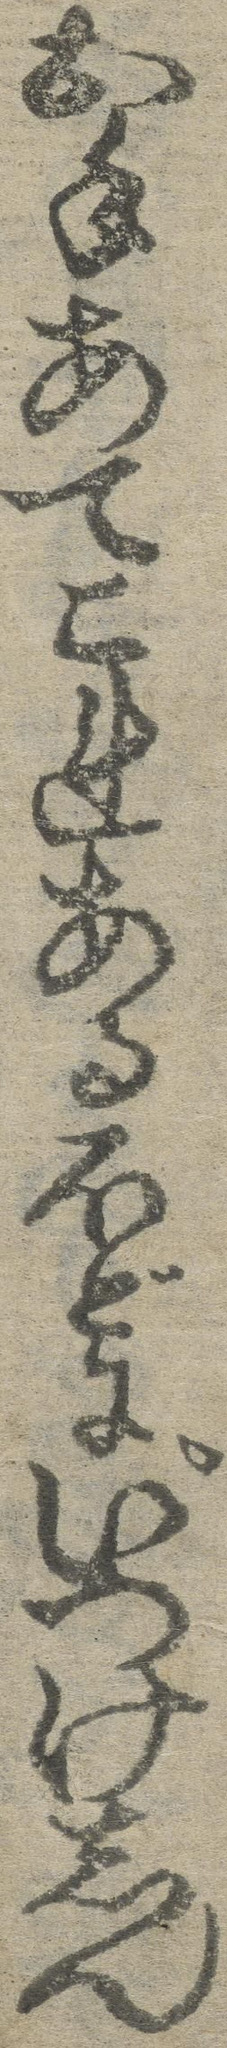お手あてこれあるほどに。いつけしん
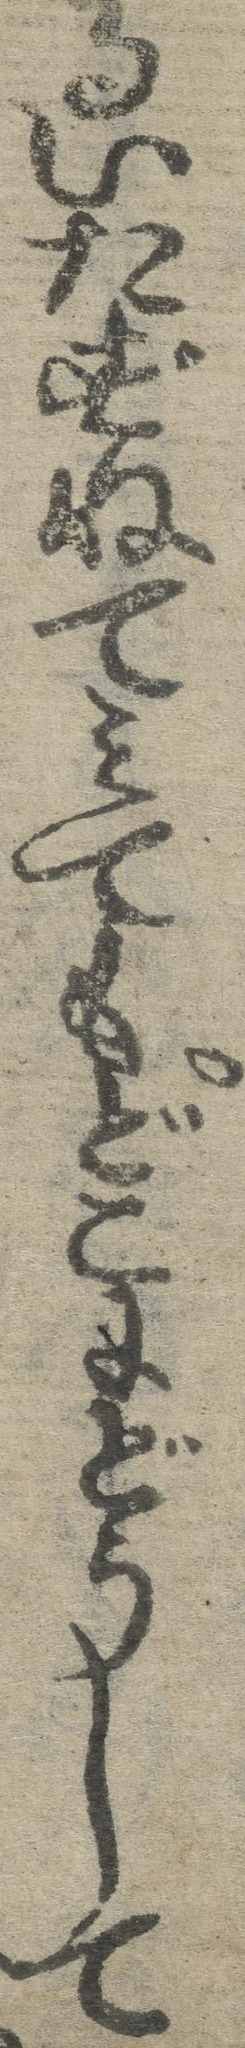るいたずねてみても。どこにどうして
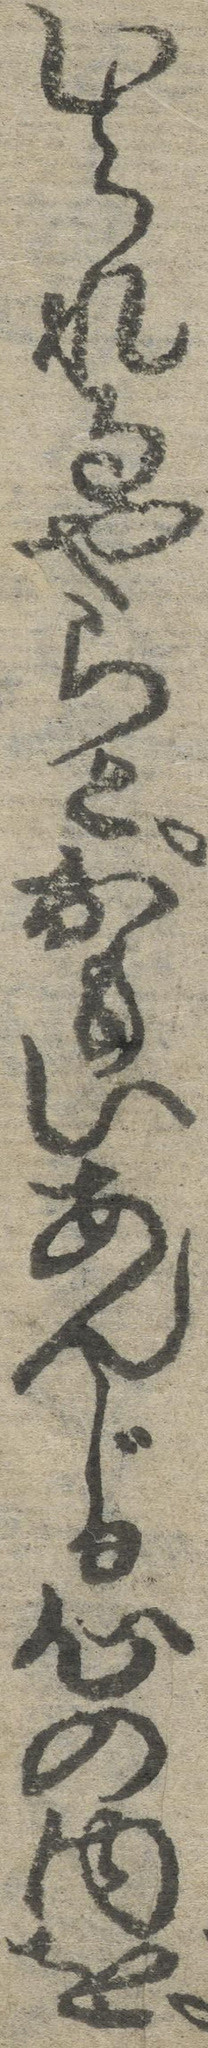いられるやらと。おもいあんじる心の内を。
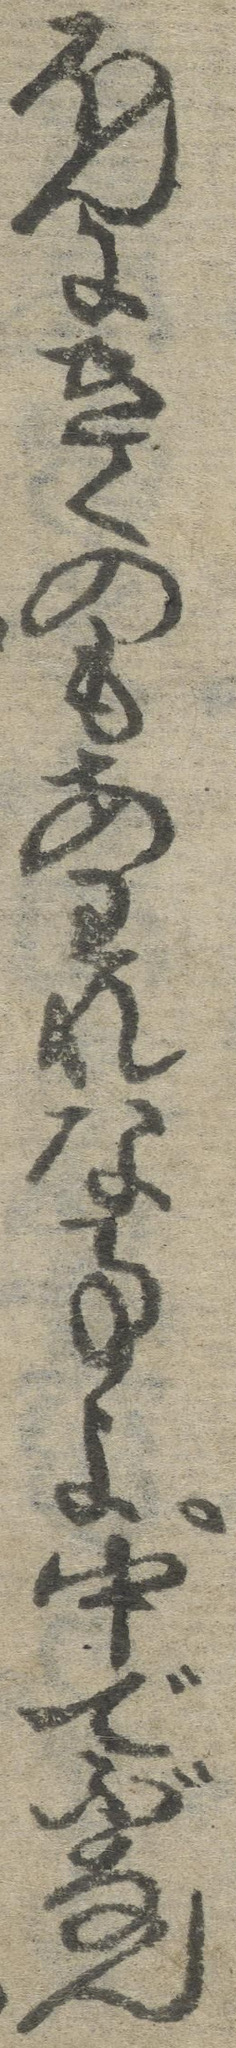ほんにきくのもあわれな事よ。中でぶなん
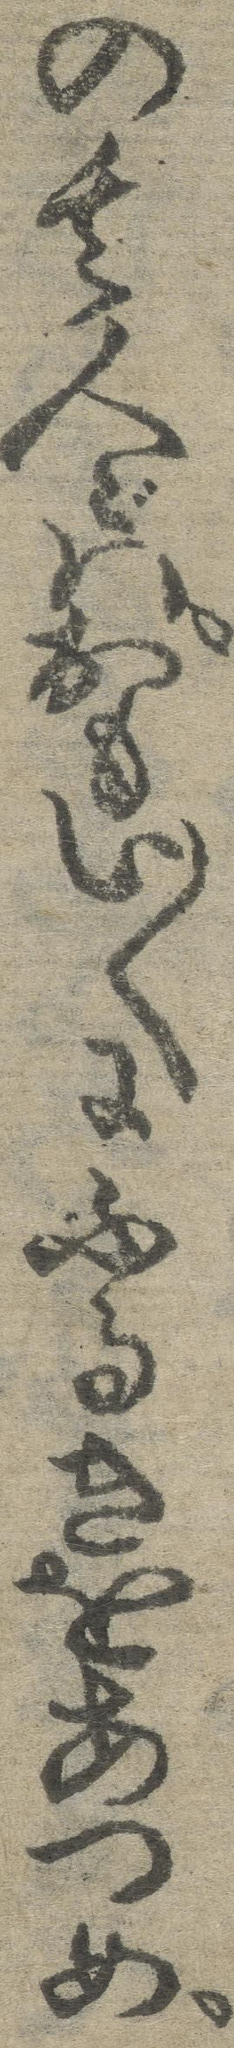の其人ゞは。おもい〳〵にふるきをあつめ。

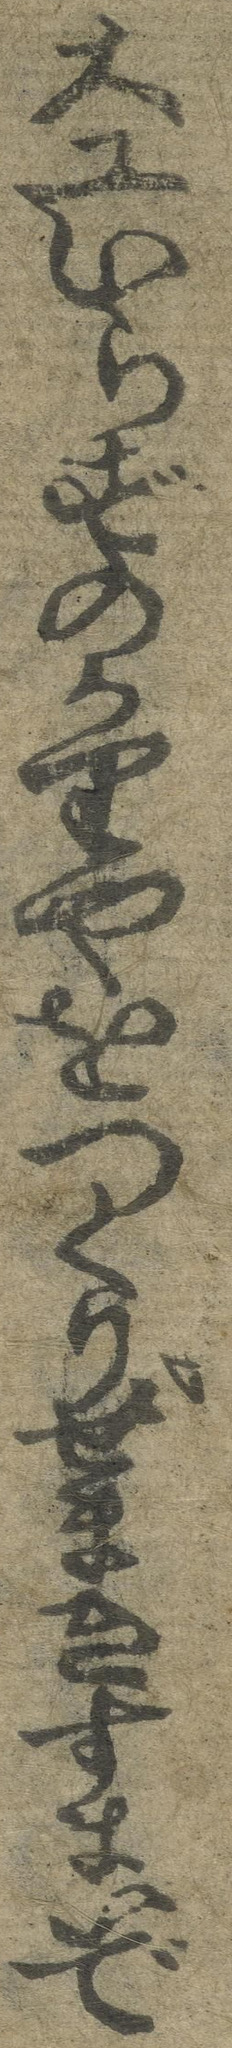大工いらずのかりやをつくり。せまきすまいで
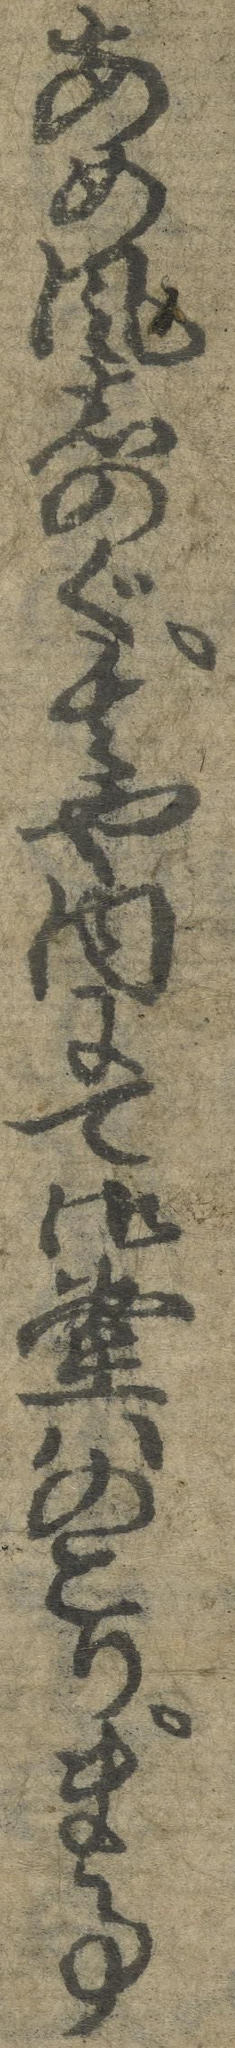あめ風しのぐ。其や内にて御堂はのこり。ま事
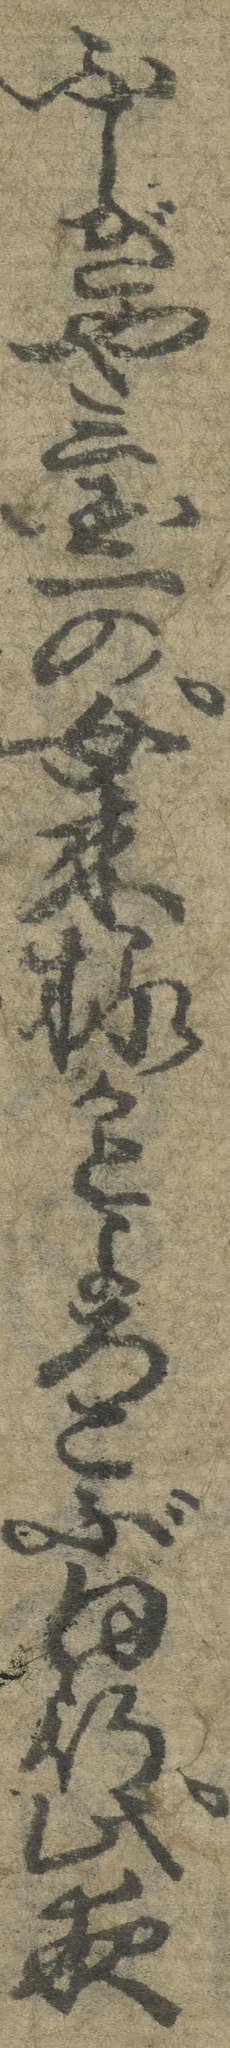ふしぎや三国一の。女来様かとよろこぶ向行。此夜
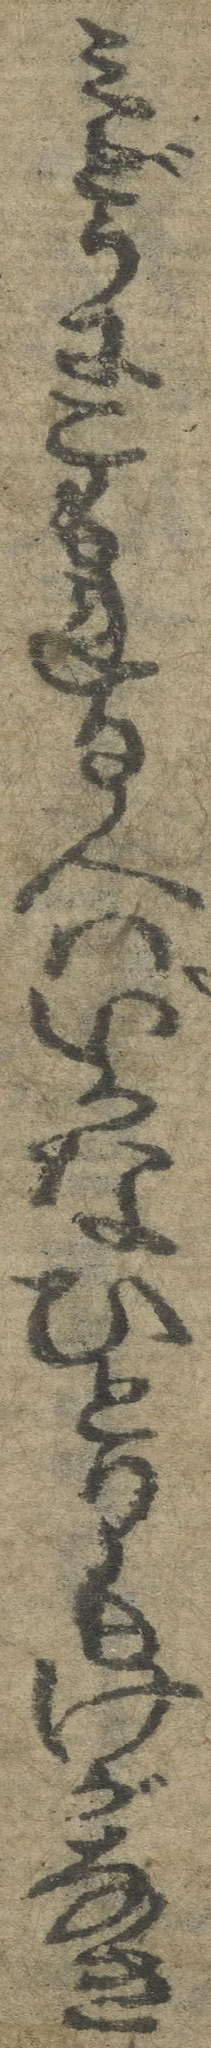みどうにこもれる人は。いかなひとりもげかなき
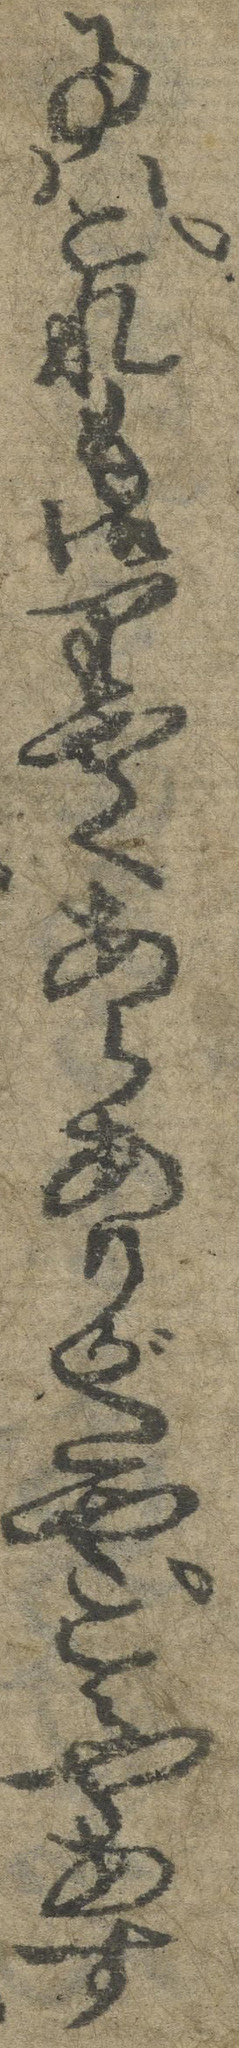事は。これも御りやくあらありがたや。こゝやあす
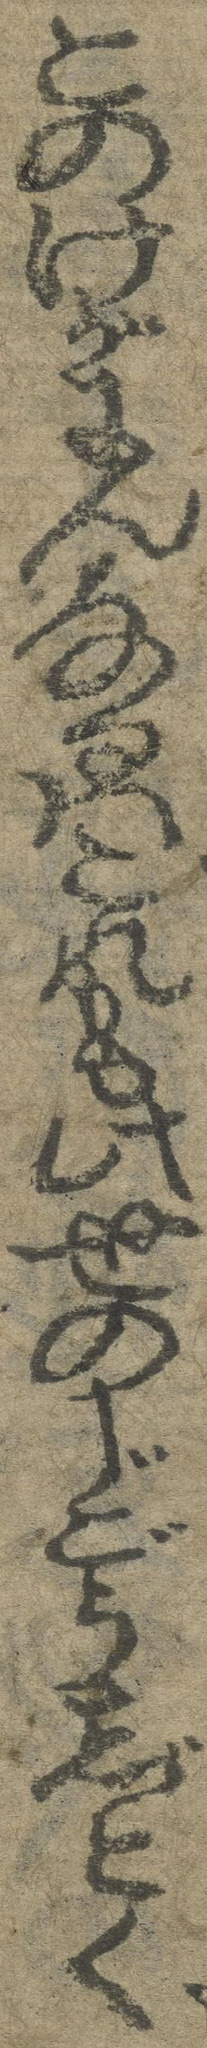このけがにんなるは。これも此世のじごうじとく。
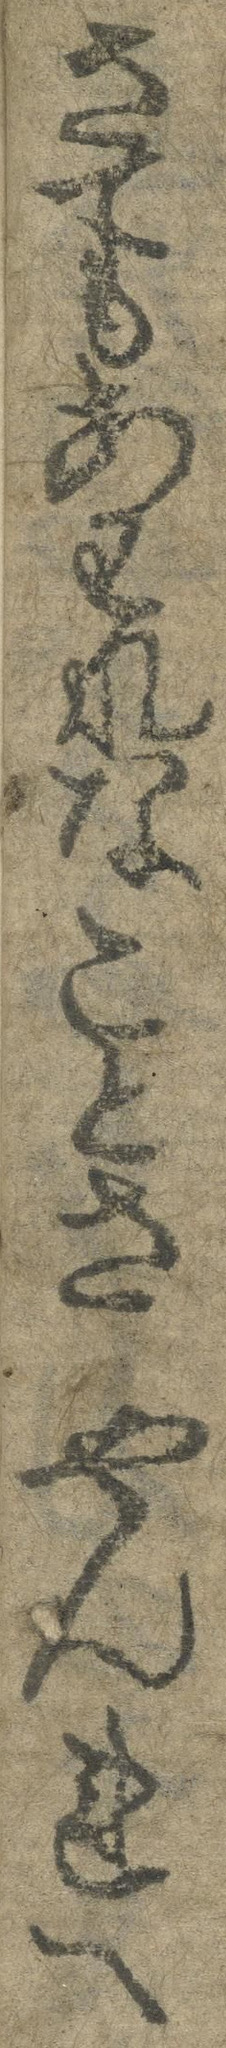さてもあわれなことさやんれへ
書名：信州ぢしんやんれぶし　上・下
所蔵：東京大学地震研究所図書室 Earthquake Research Institute Library, The University of Tokyo, JAPAN
